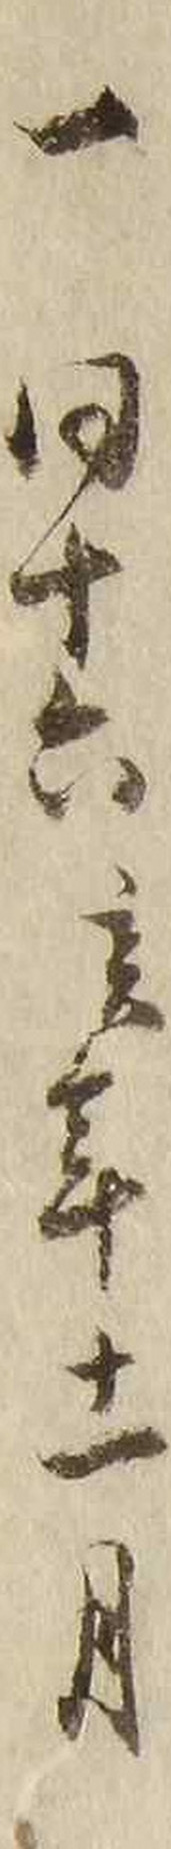一同十六亥年十一月

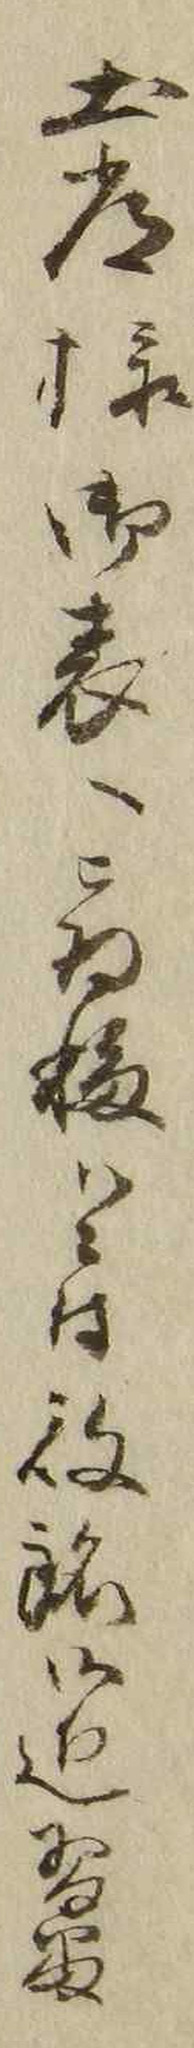土常様御表へ被為移候ニ付役銘御近習番
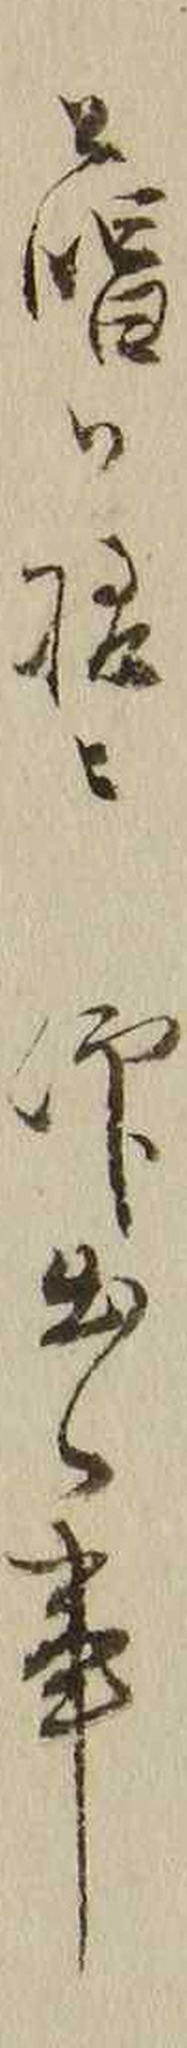と唱候様被仰出候事
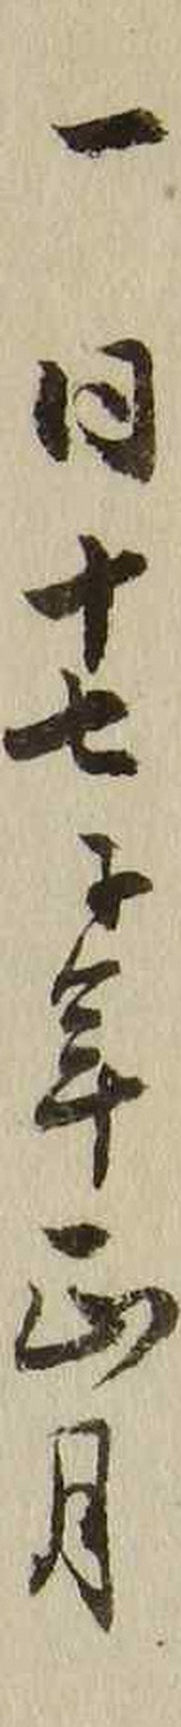一同十七子年正月
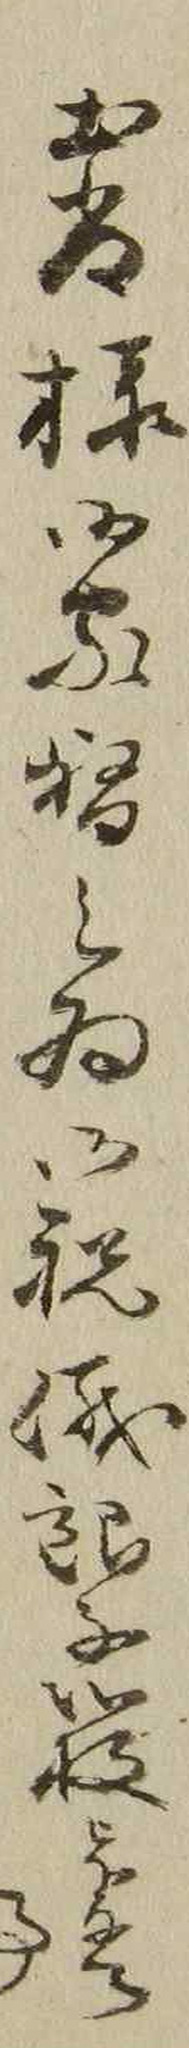土常様御家督之爲御祝儀銀子弐枚被下置候事
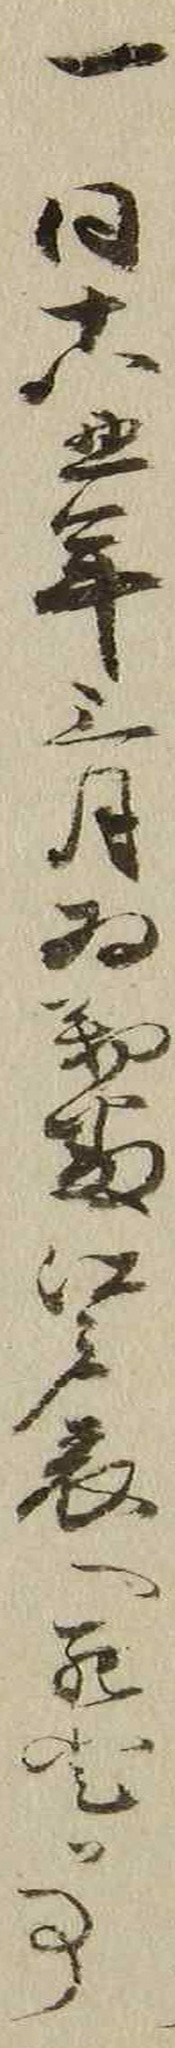一同十八丑年三月為勤番江戸表へ罷登候事
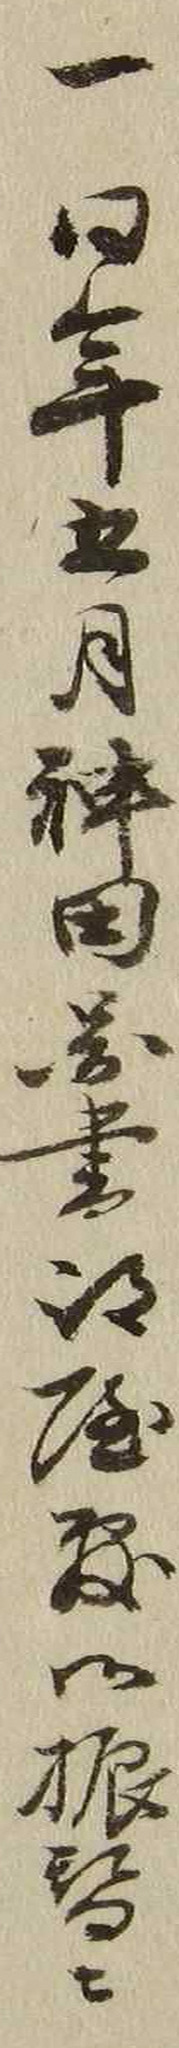一同年五月神田図書跡屋敷御振替被
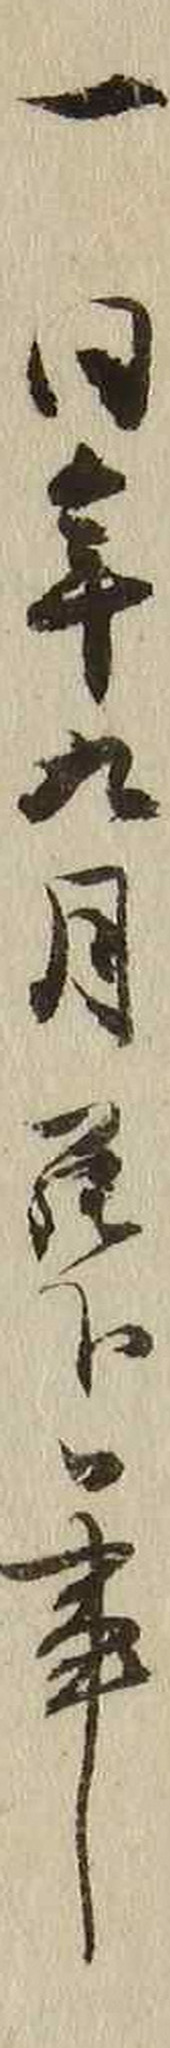一同年九月罷下候事
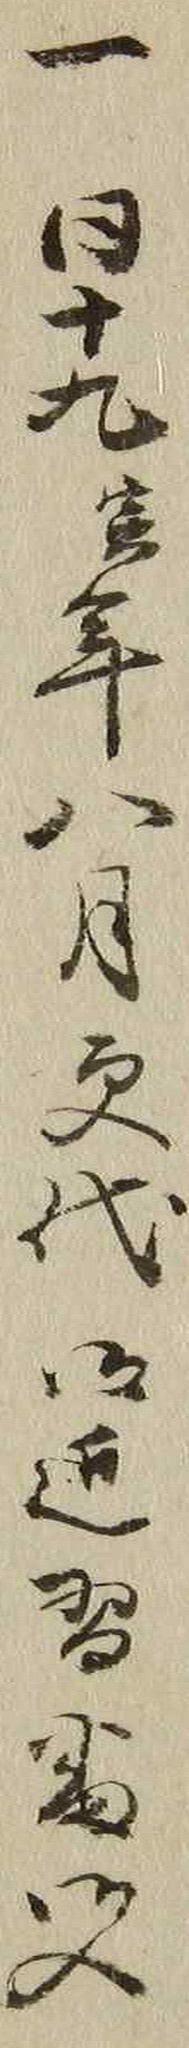一同十九寅年八月更代御近習番御入
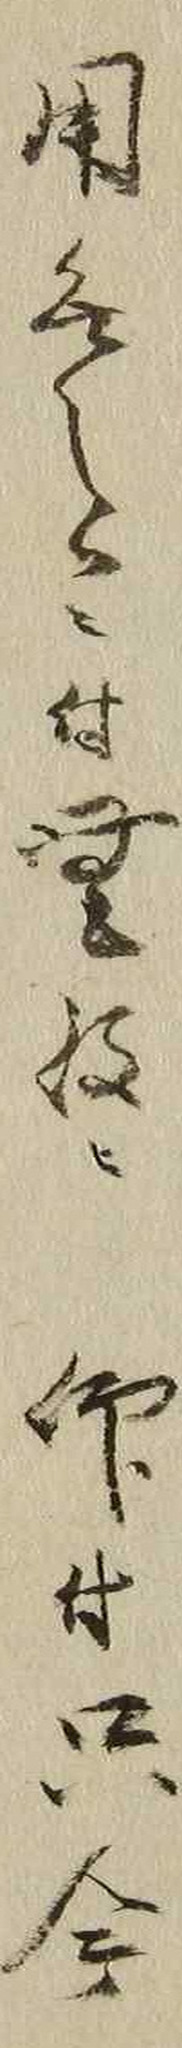用無之候ニ付無役被仰付只今
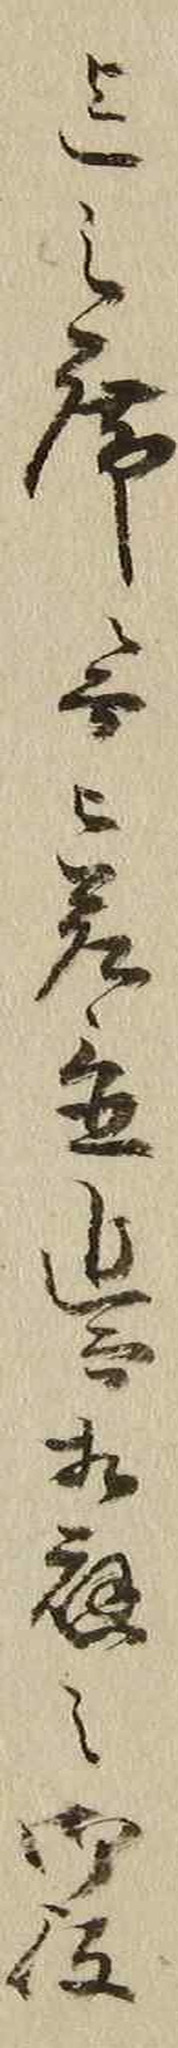迄之席ニ而被差置追而相応之御役
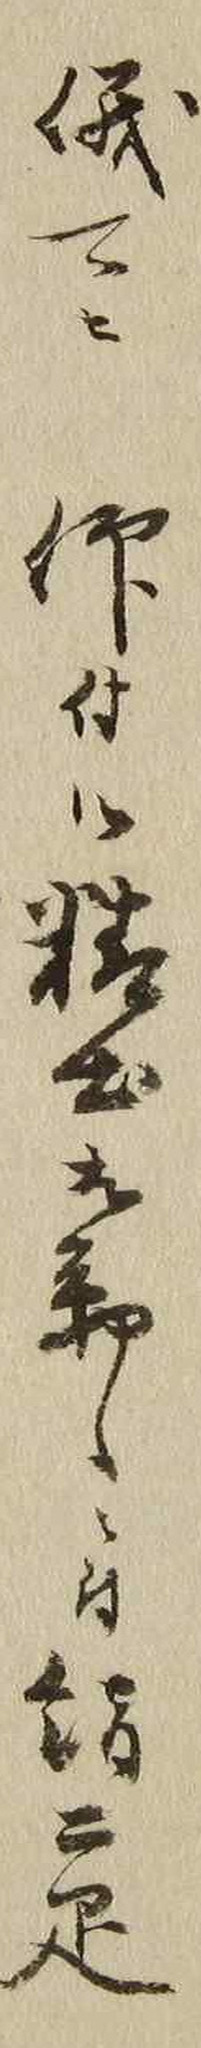儀可被仰付候精出相勤候ニ付絹二疋
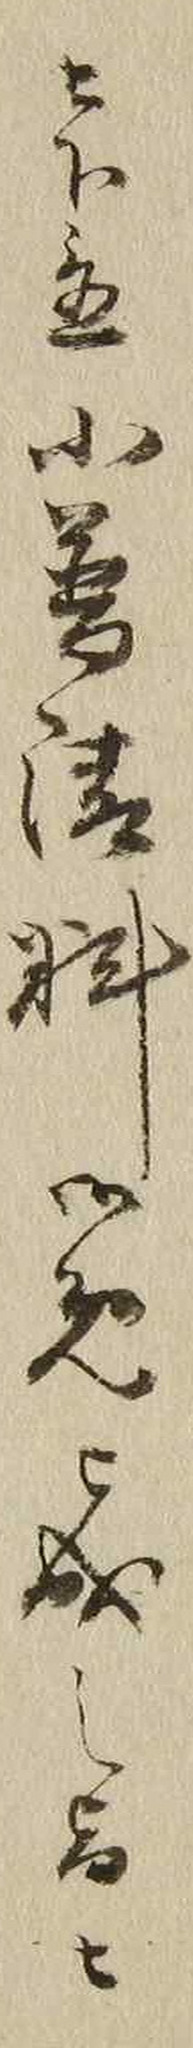被下置小普請料御免被成之旨被
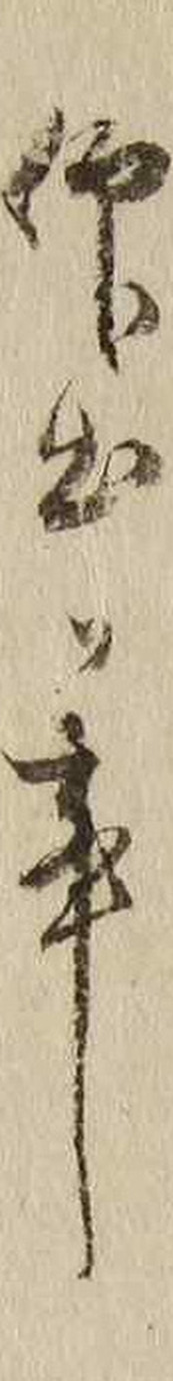抑出候事
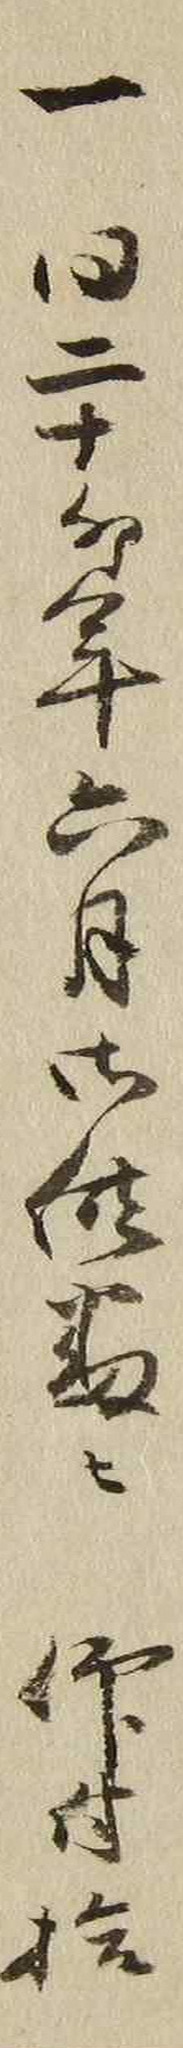一同二十卯年六月御供番被仰付拾
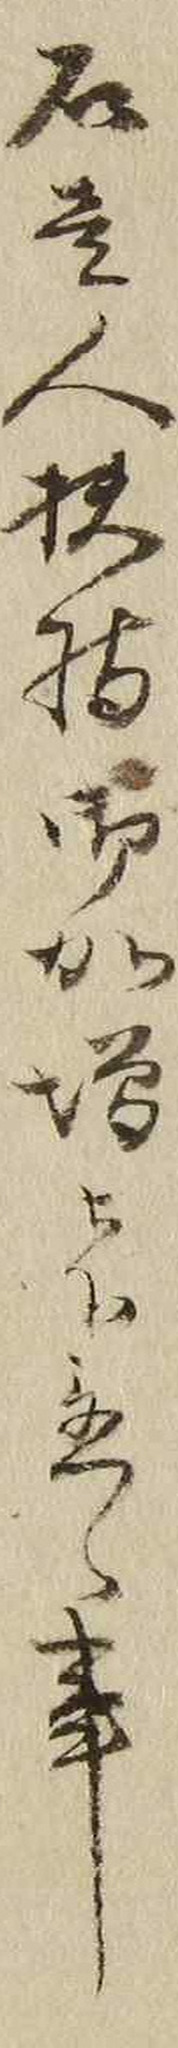石壱人扶持御加増被下置候事
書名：諸士系譜　巻之232　け之部1
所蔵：会津若松市立会津図書館
